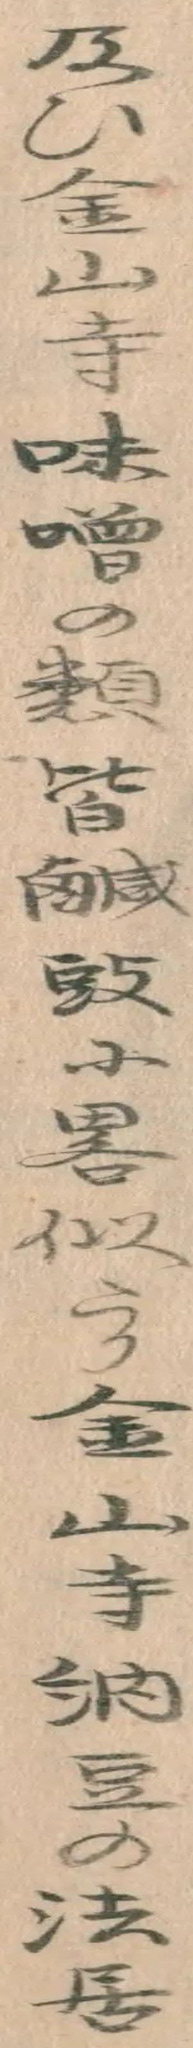及ひ金山寺味噌の類皆鹹豉に略似たり金山寺納豆の法居
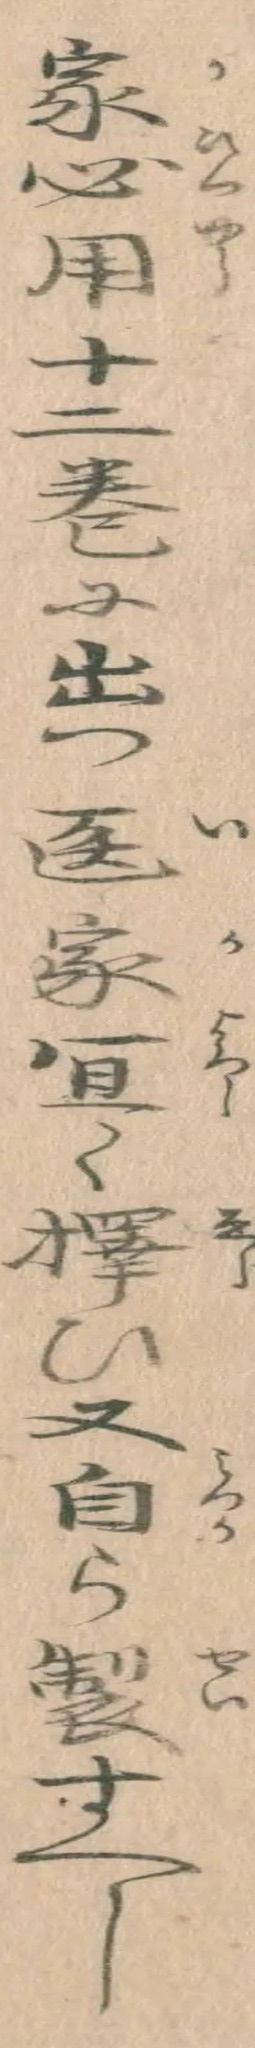家必用十二巻に出つ医家宜く択ひ又自ら製すへし
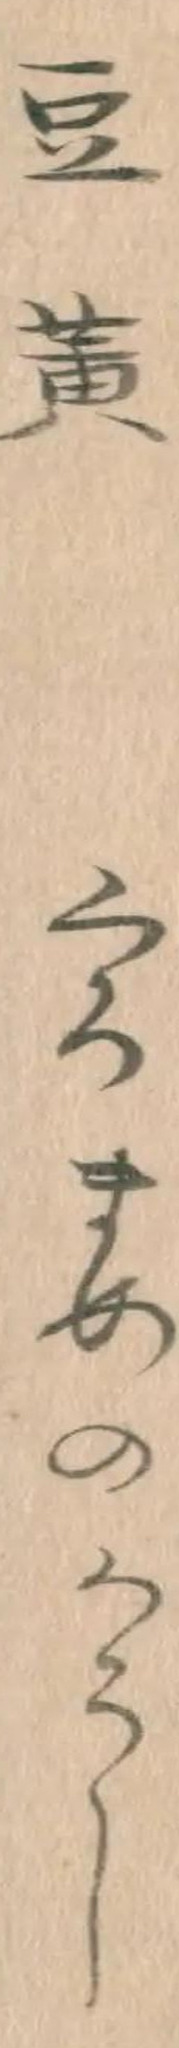豆黄くろまめのかうし
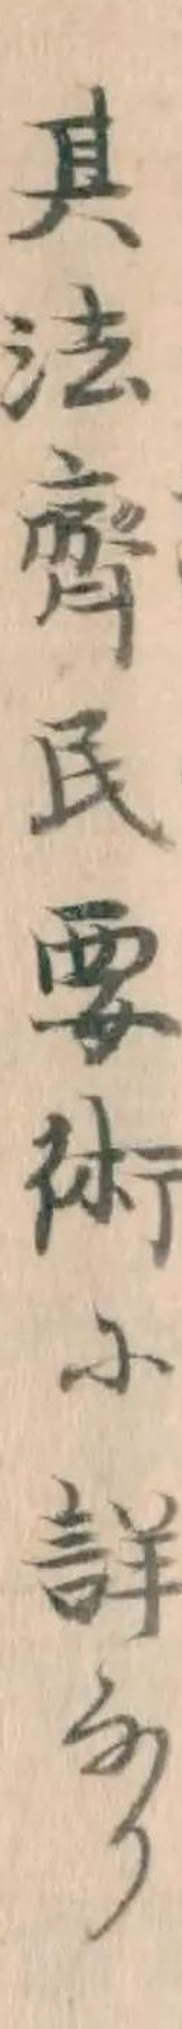其法斉民要術に詳なり
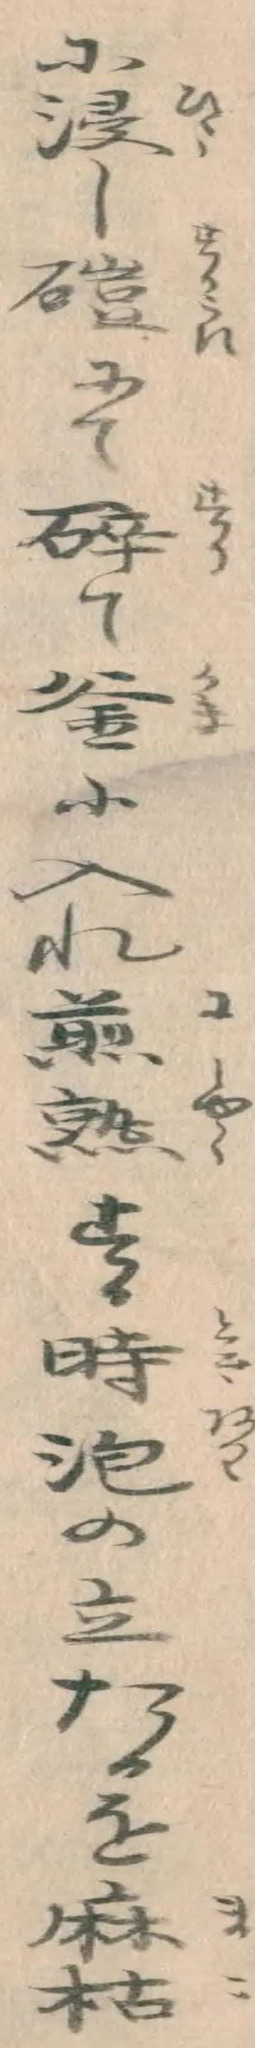に浸し磑にて砕て釜に入れ煎熟する時泡の立たるを麻枯
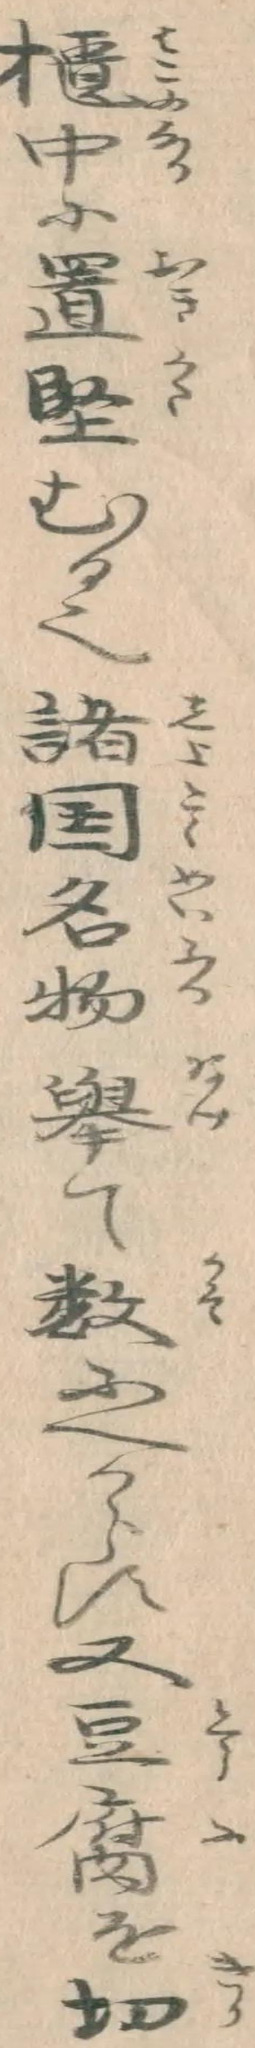櫃中に置堅むる也諸国名物挙て数ふへからす又豆腐を切
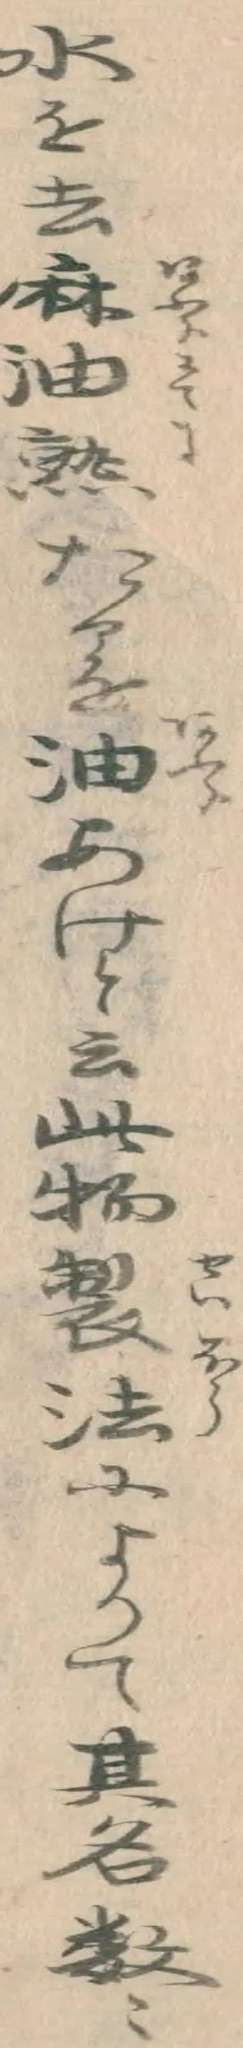水を去麻油熟たるを油あけと云此物製法によりて其名数〻

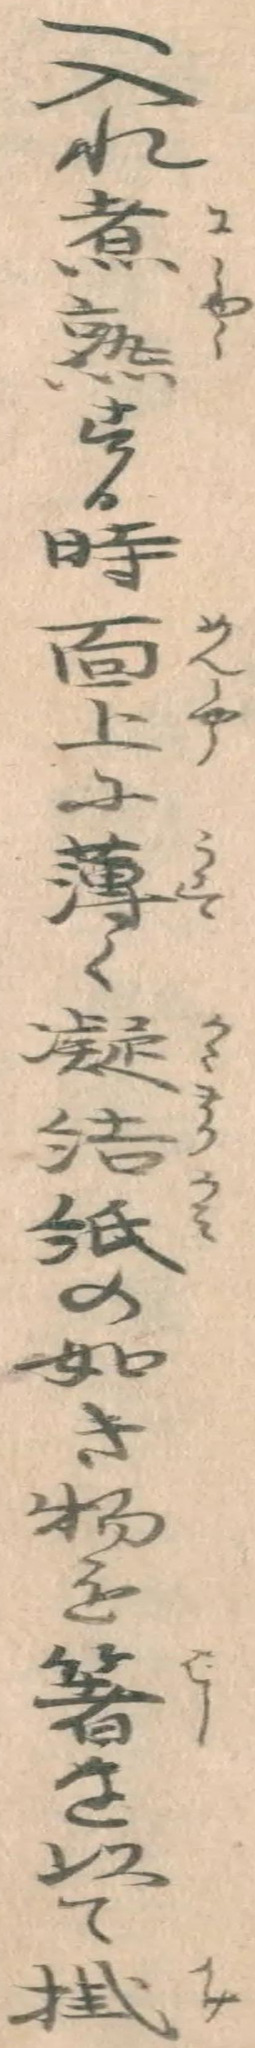へ入れ煮熟する時面上に薄く凝結紙の如き物を箸を以て掛
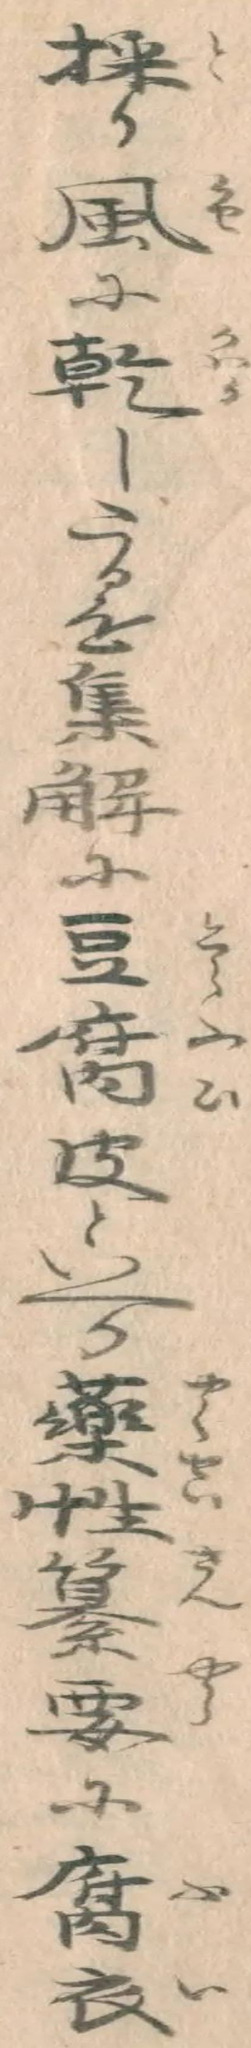採り風に乾したるを集解に豆腐皮といへり薬性纂要に腐衣
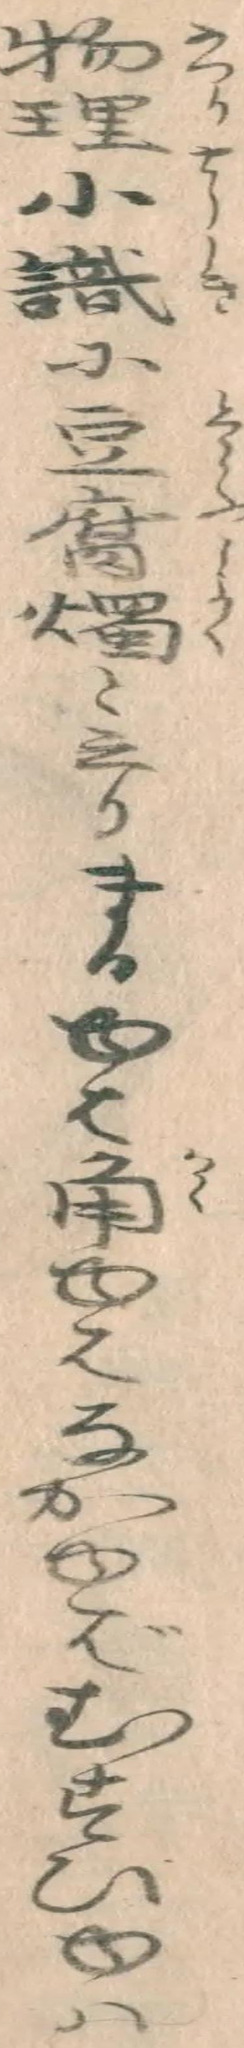物理小識に豆腐燭と云りまるゆは角ゆはなかゆばむすひゆは
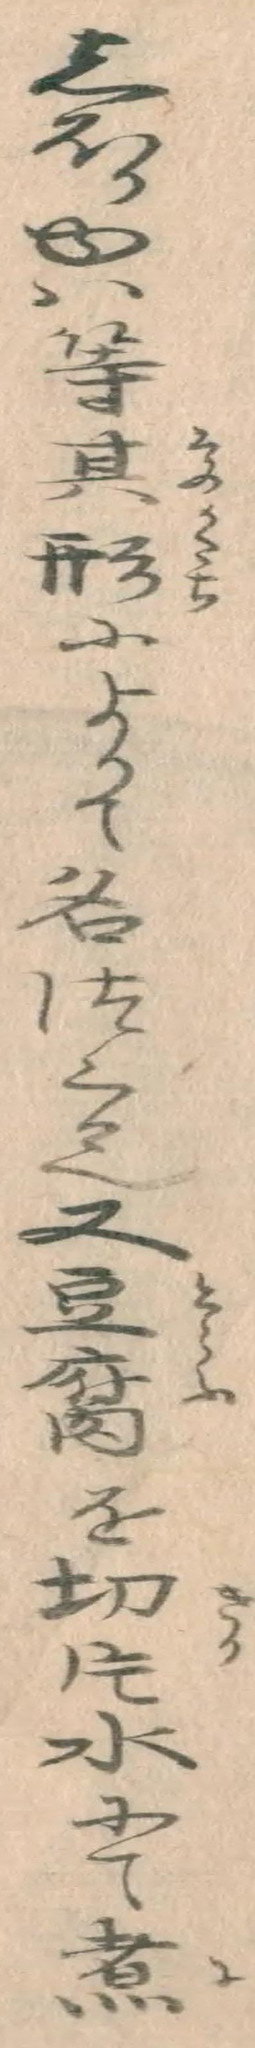しほりゆは等其形によりて名つくる也又豆腐を切片水にて煮
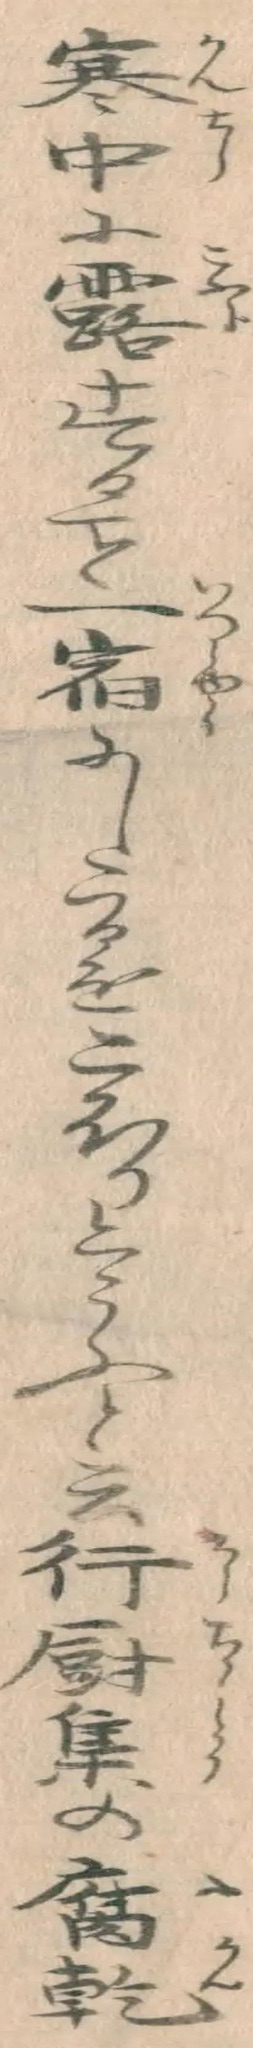寒中に露すること一宿にしたるをこほりとうふと云行厨集の腐乾
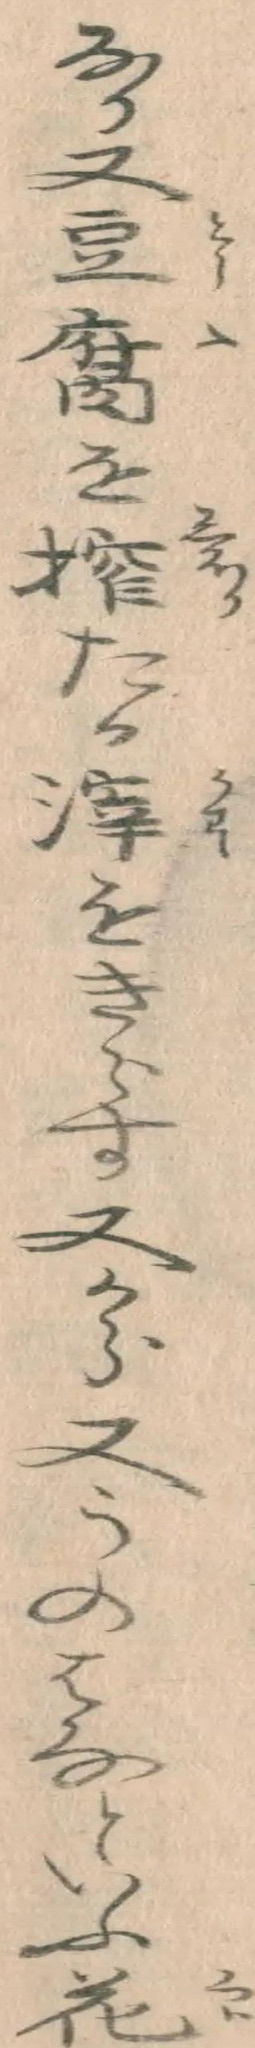なり又豆腐を搾たる滓をきらす又から又うのはなといふ花
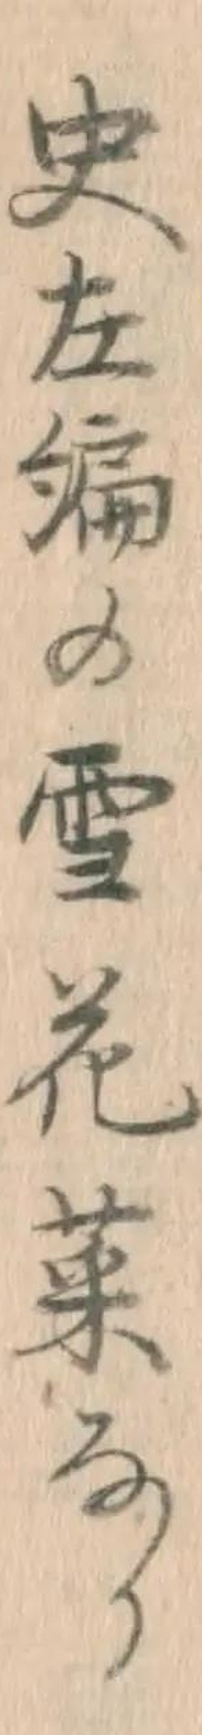史左編の雪花菜なり
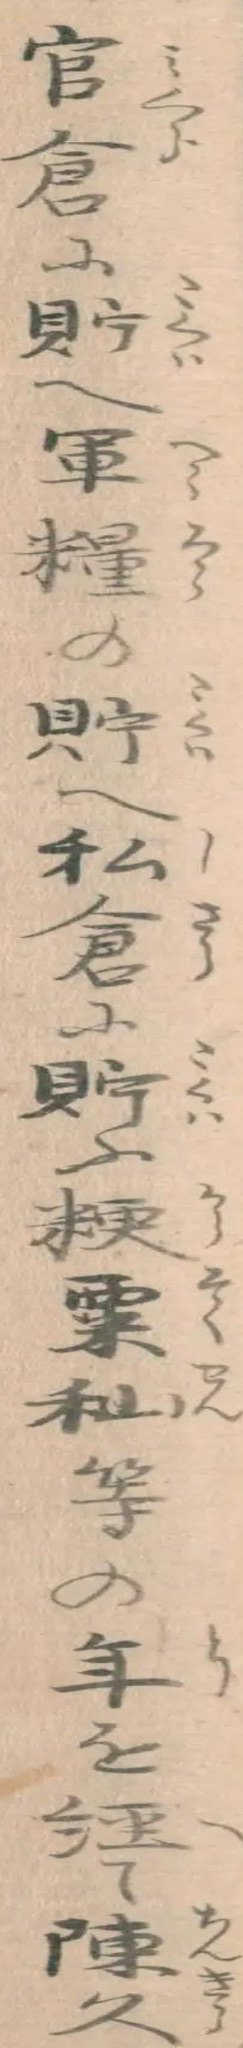官倉に貯へ軍糧の貯へ私倉に貯ふ粳粟秈等の年を経て陳久
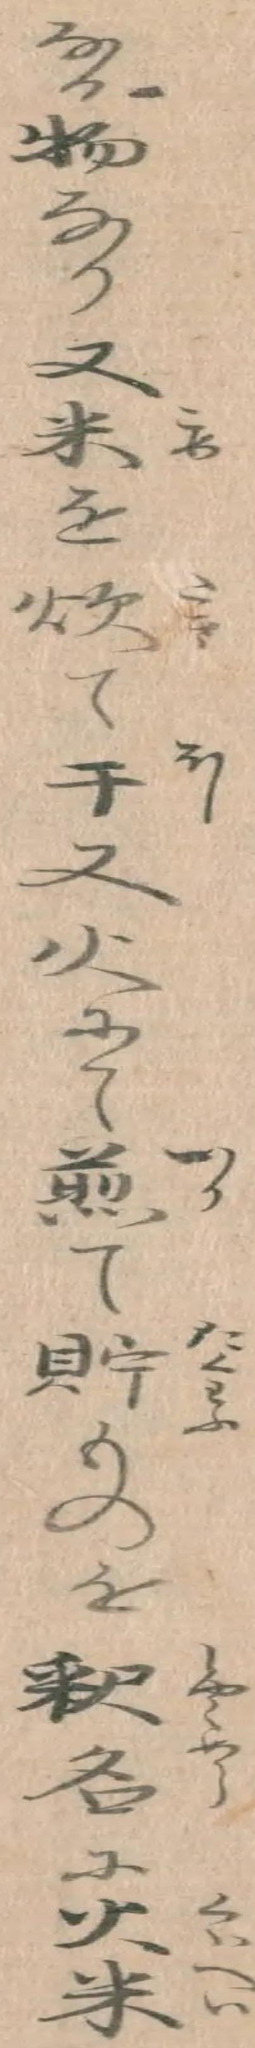なる物なり又米を炊て干又火にて煎て貯ものを釈名に火米
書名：本草図譜. 巻43-45
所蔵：国立国会図書館 National Diet Library, JAPAN
